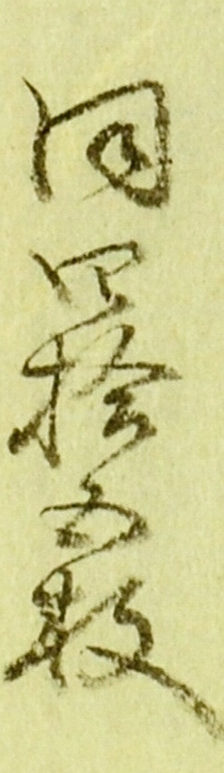同四拾五枚
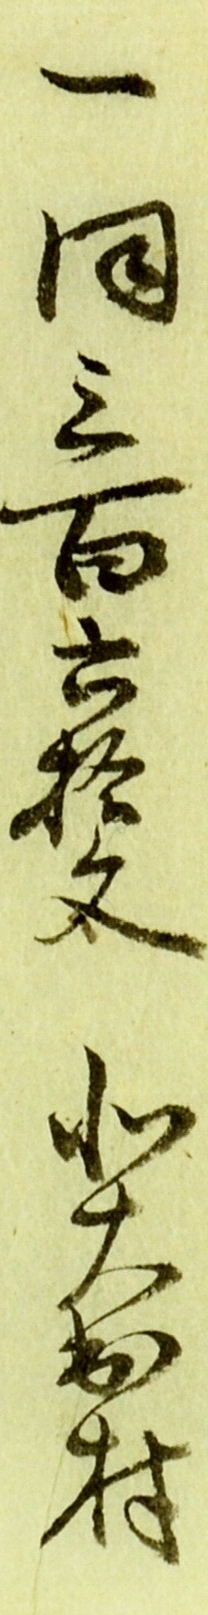一同三百六拾文北大出村
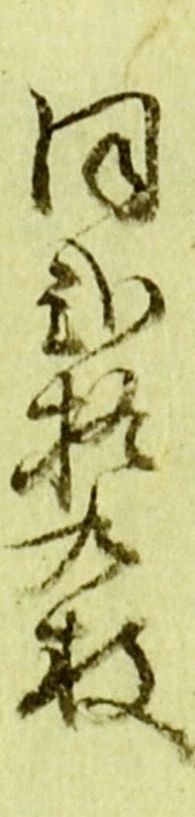同弐拾九枚
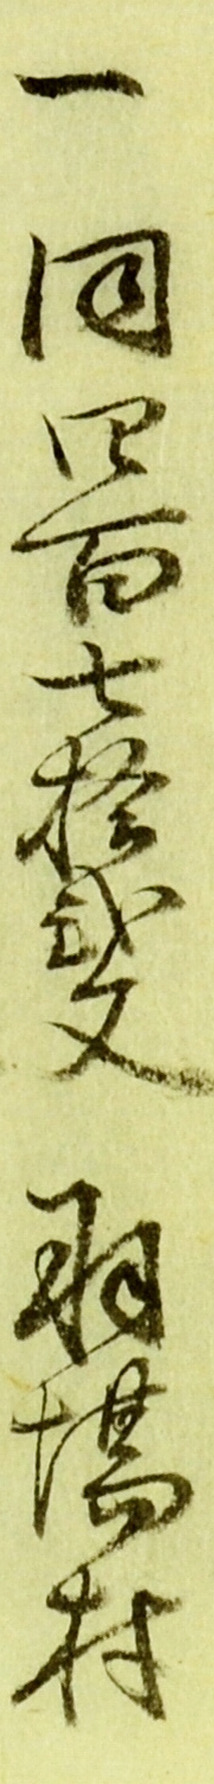一同四百七拾弐文羽場村
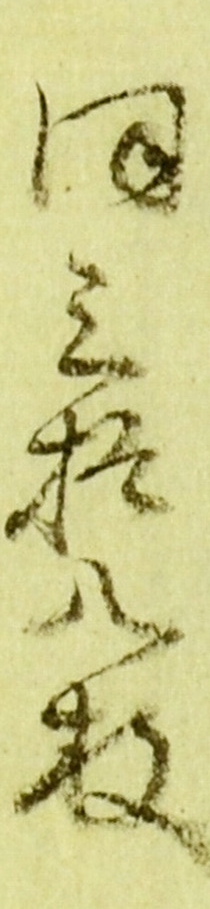同三拾八枚
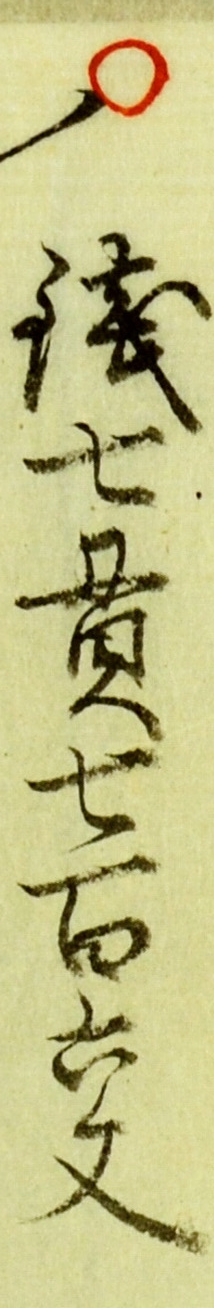〇銭七貫七百六文
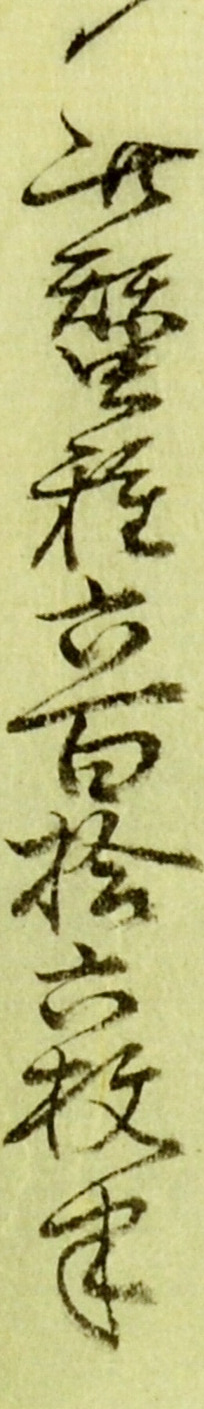〆此蚕種六百拾六枚半

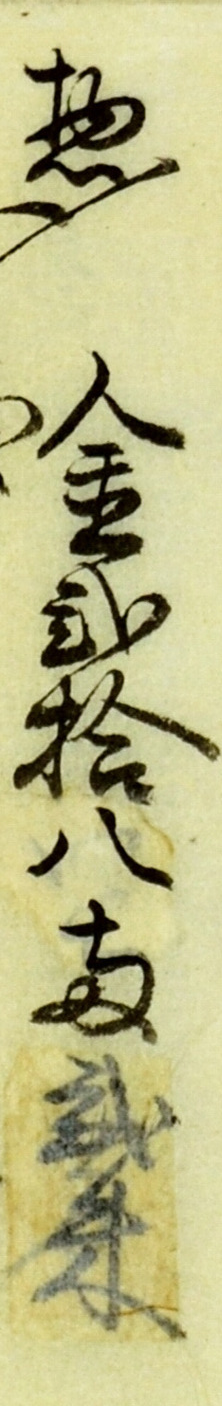惣〆金弐拾八両
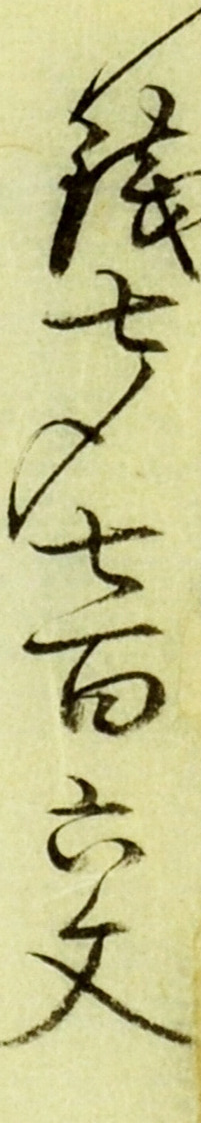銭七貫七百六文

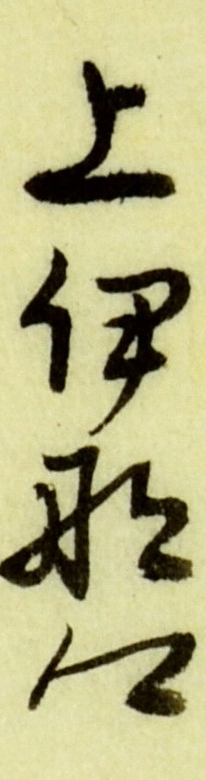上伊那郷
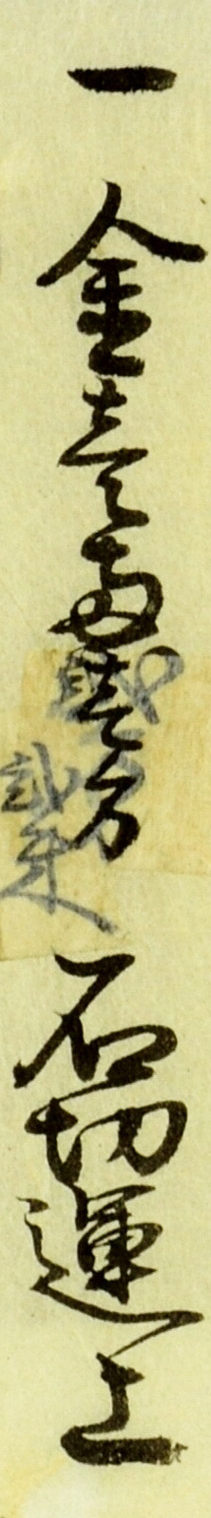一金壱両壱分石切運上
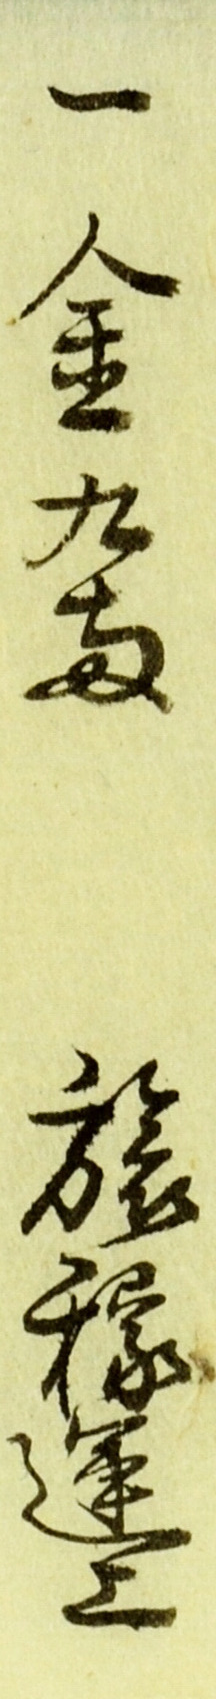一金九両旅稼運上
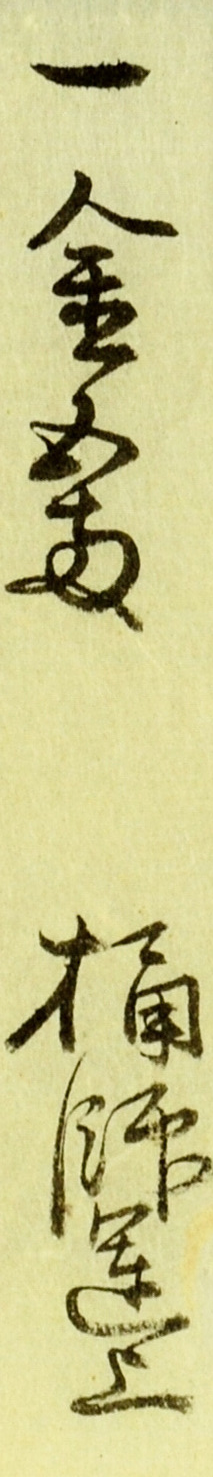一金五両桶師運上
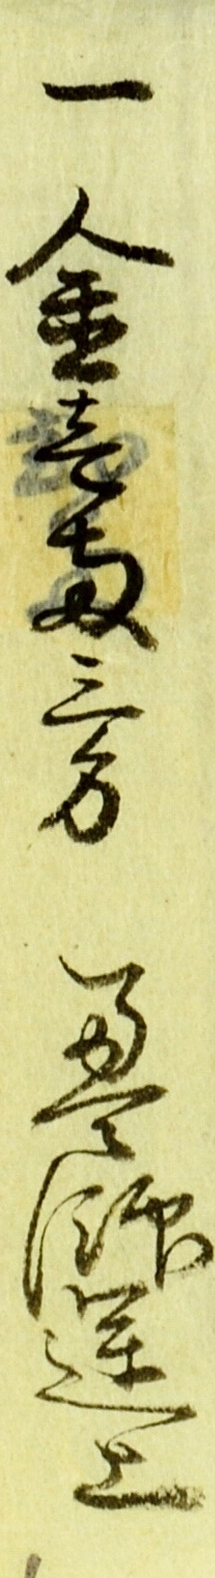一金壱両三分畳師運上
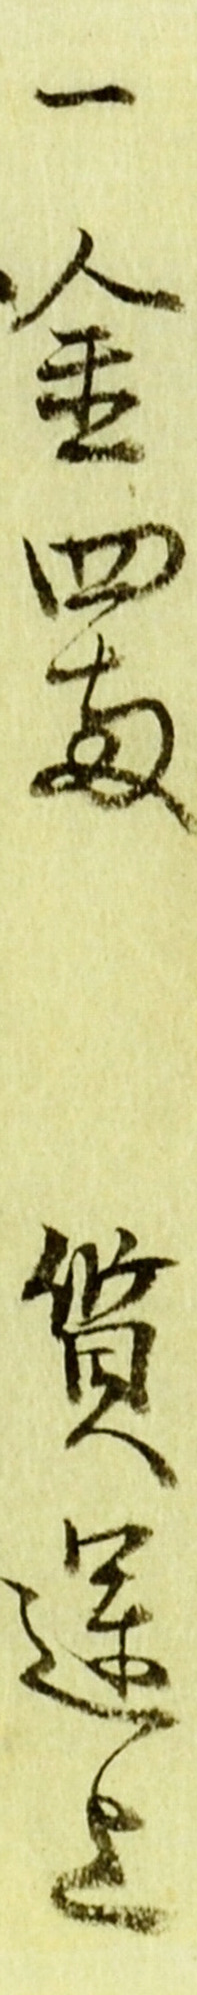一金四両質運上
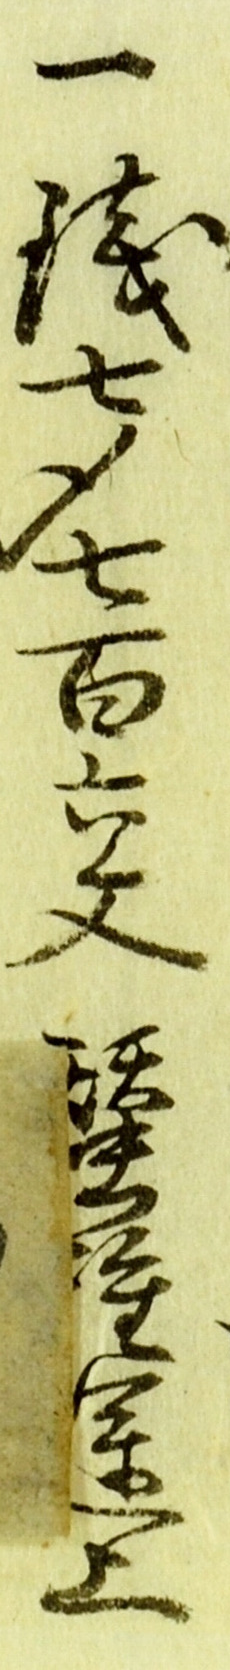一銭七貫七百六文蚕種運上
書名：上伊那郷諸運上取調帳
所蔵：伊那市立高遠町図書館・合同会社AMANE
